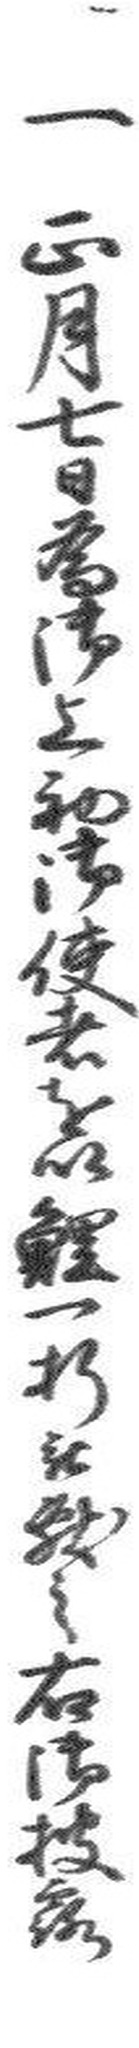一正月七日為御上初御使者を以鯉一折被献之右御披露
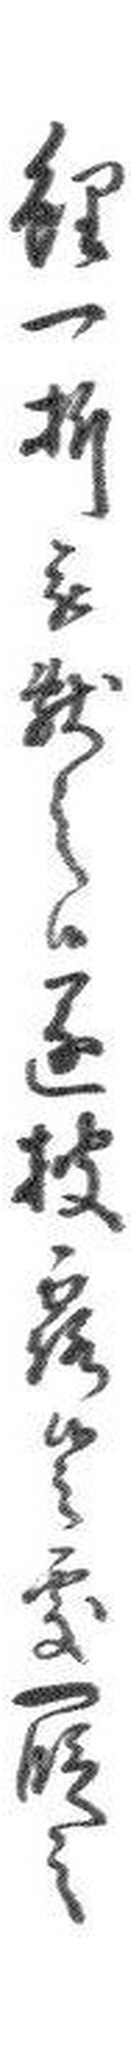鯉一折被献之候遂披露候之処一段之
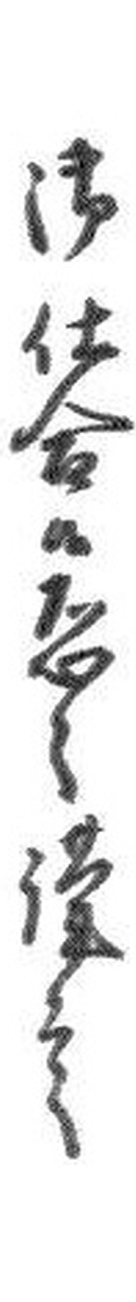御仕合候恐々謹言
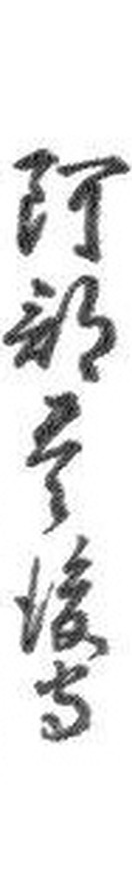阿部豊後守
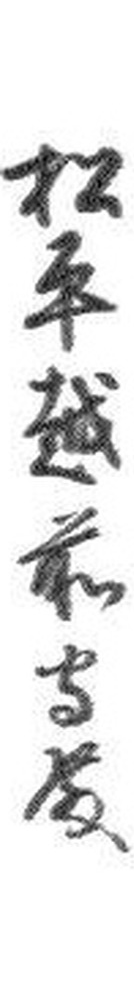松平越前守殿

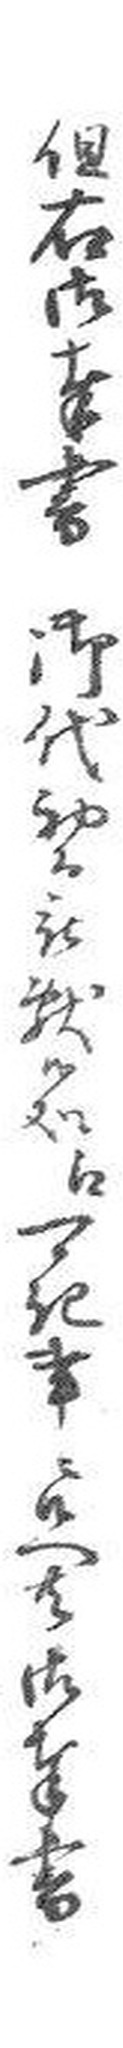但右御奉書御代初而被献候処江可記事ニ候ヘ共御奉書
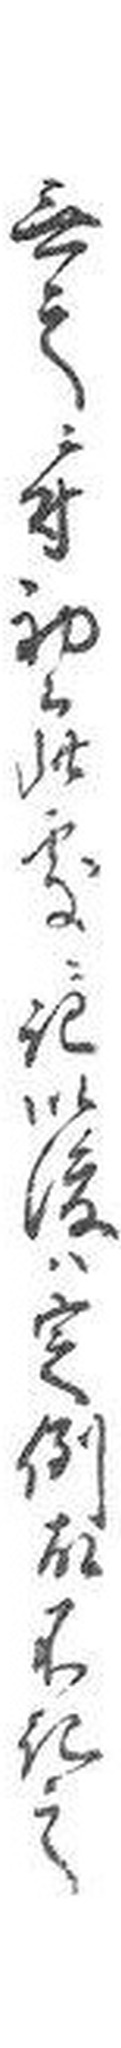無之ニ付初而此処ニ記以後は定例故不記之
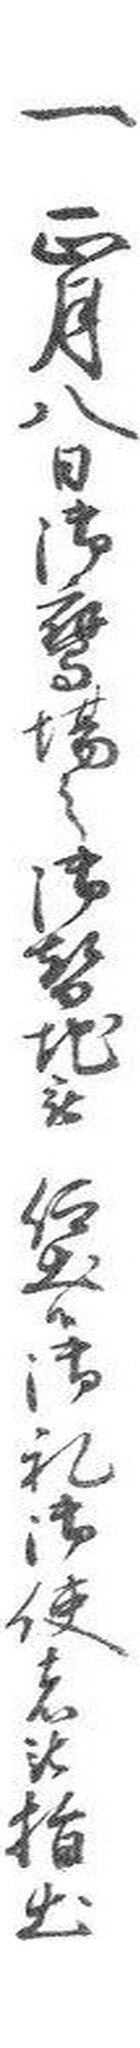一正月八日御鷹場之御替地被仰出候御礼御使者被指出
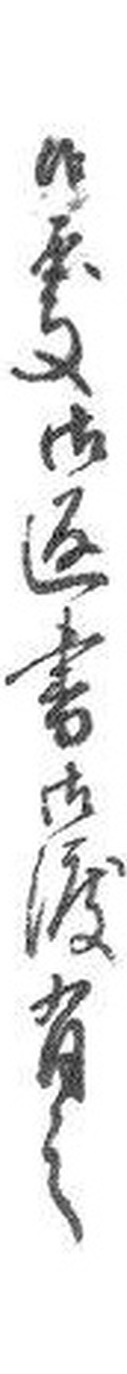候処御返書御渡有之
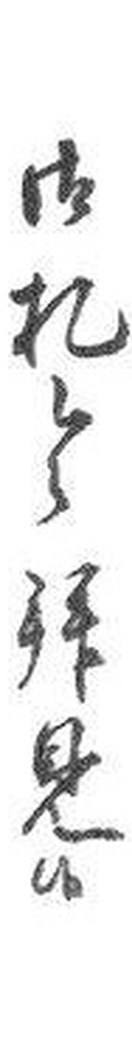御札令拝見候
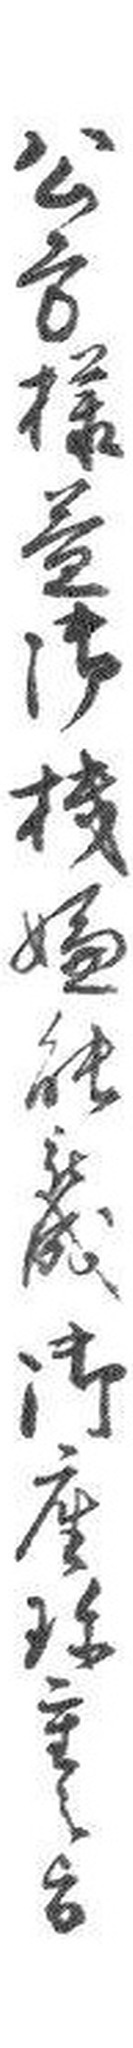公方様益御機嫌能被成御座珎重之旨
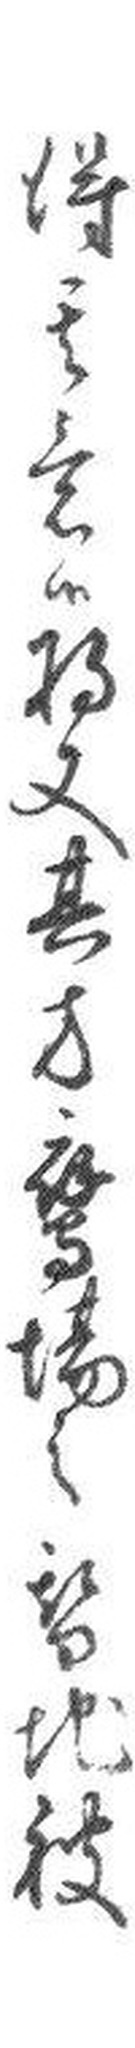得其意候将又其方鷹場之替地被
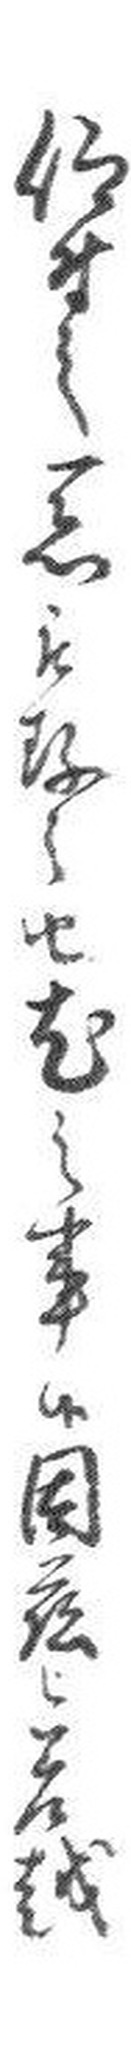仰付之忝被存候由尤之事候因茲被差越
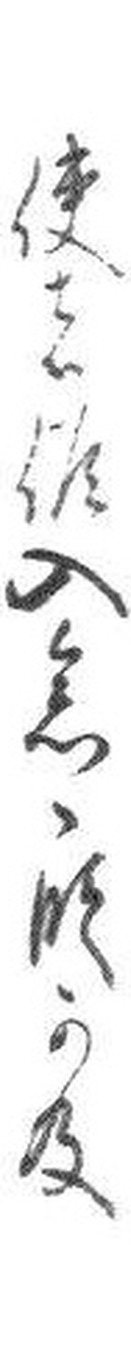使者候入念候段可及
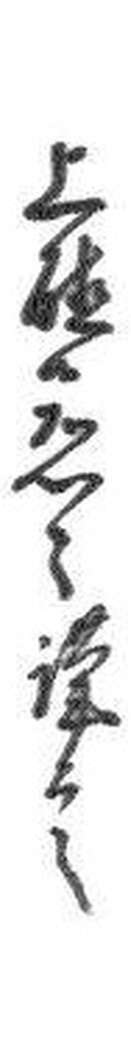上聴候恐々謹言
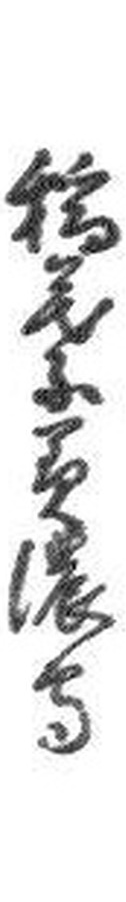稲葉美濃守
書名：家譜 六 光通公 従万治三年到寛文三年
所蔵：福井県文書館 Fukui Prefectural Archives
